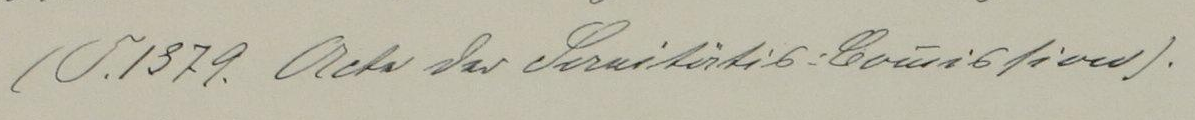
(T.1379. Acte der Sanitätis-Commission).
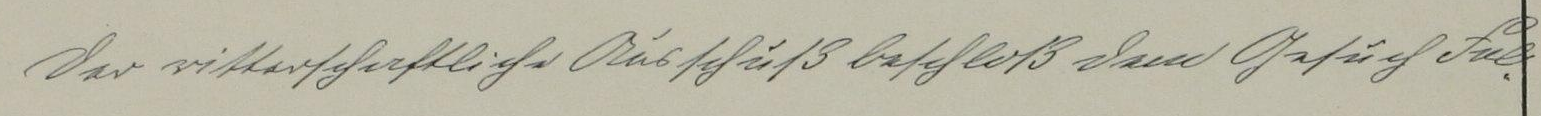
Der ritterschaftliche Ausschuß beschloß, dem Gesuch Fol-
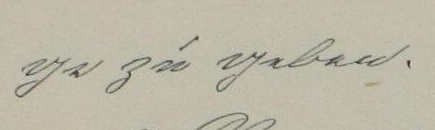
ge zu geben.
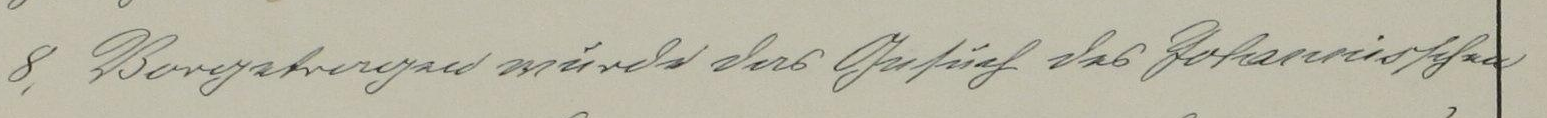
8. Vorgetragen wurde das Gesuch des Johannisschen
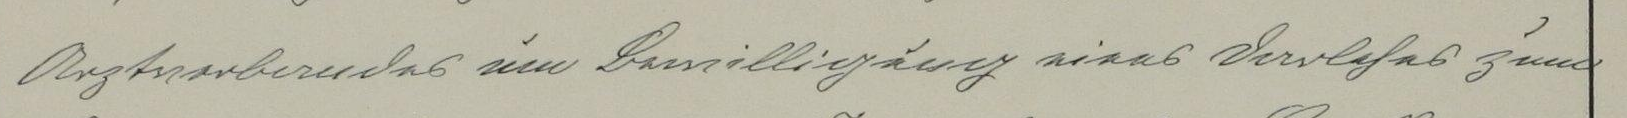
Arztverbandes um Bewilligung eines Darlehns zum
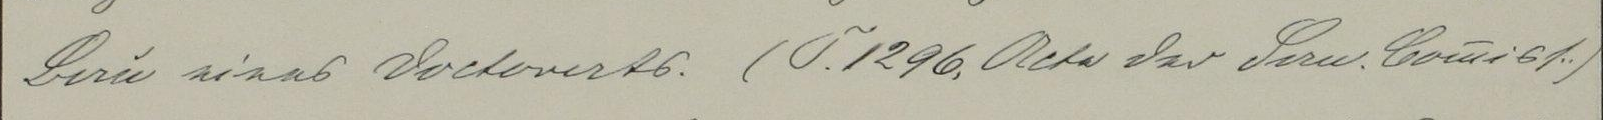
Bau eines Doctorats. (T.1296. Acte der San. Commiss.)
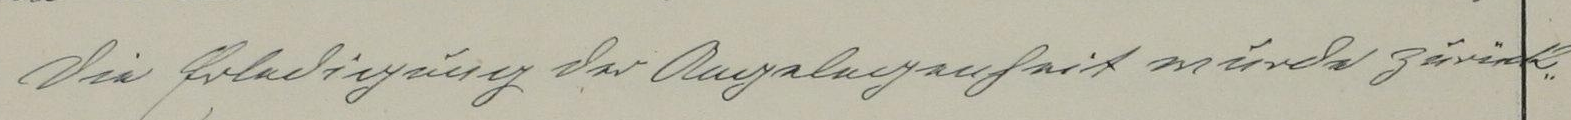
Die Erledigung der Angelegenheit wurde zurück-
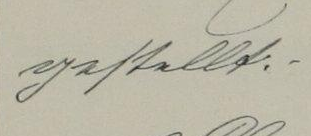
gestellt.
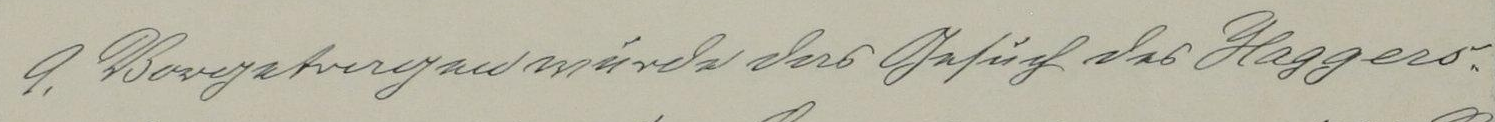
9. Vorgetragen wurde das Gesuch des Haggers-
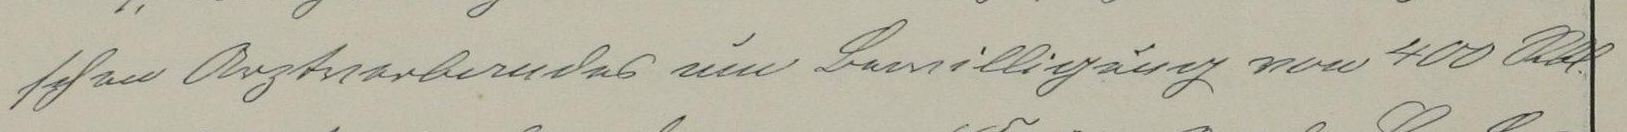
schen Arztverbandes um Bewilligung von 400 Rbl.
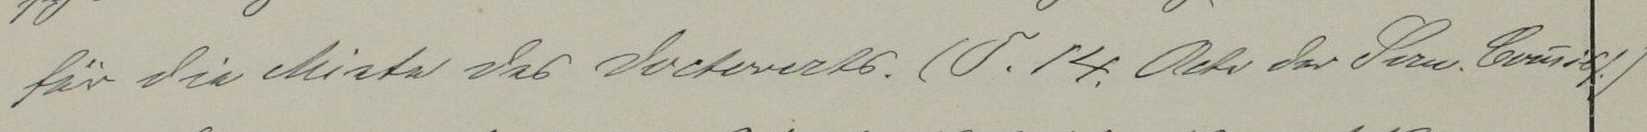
für die Miete des Doctorats. (T.14. Acte der San. Commiss.)
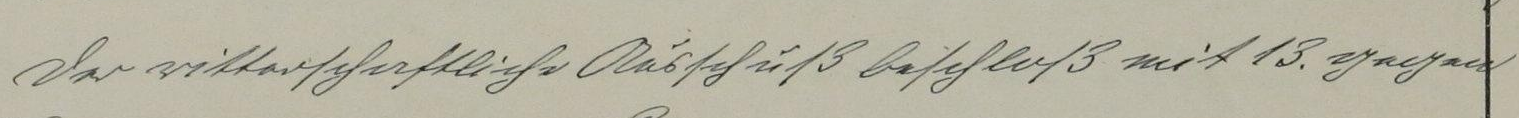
Der ritterschaftliche Ausschuß beschloß mit 13 gegen
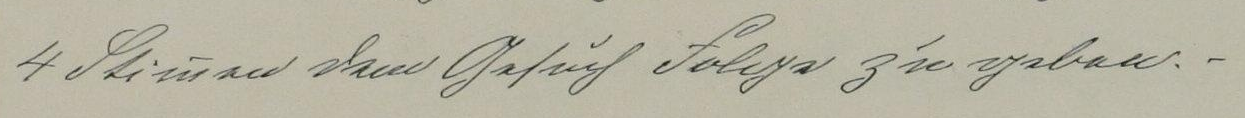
4 Stimmen dem Gesuch Folge zu geben.
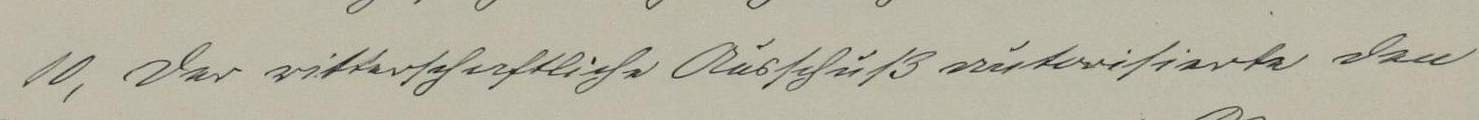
10. Der ritterschaftliche Ausschuß autorisierte den
